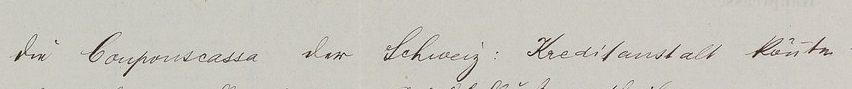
die Couponscassa der Schweiz. Kreditanstalt könnte
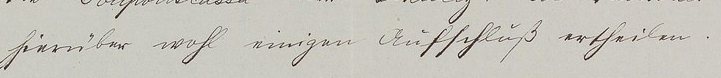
hierüber wohl einigen Aufschluß ertheilen.
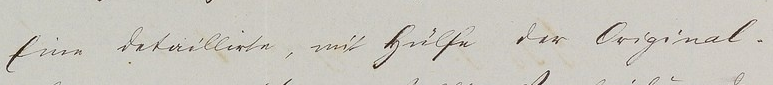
Eine detaillirte, mit Hülfe der Original-
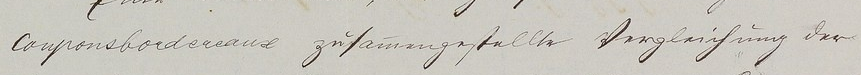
Couponsbordereaux zusammengestellte Vergleichung der
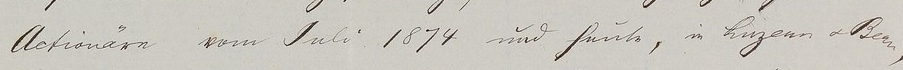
Actionäre vom Juli 1874 und heute, in Luzern & Bern,
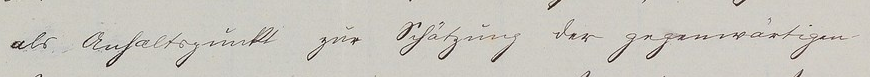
als Anhaltspunkt zur Schätzung der gegenwärtigen
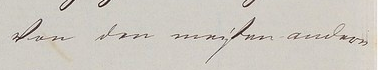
Von den meisten andern
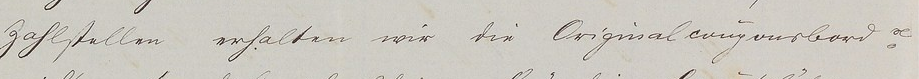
Zahlstellen erhalten wir die Originalcouponsbordx
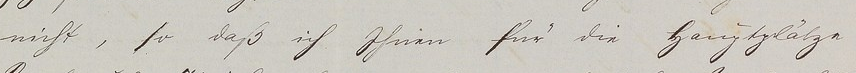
nicht, so daß ich Ihnen für die Hauptplätze
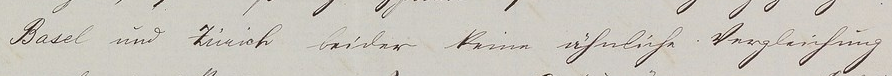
Basel und Zürich leider keine ähnliche Vergleichung
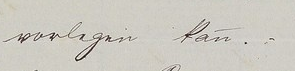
vorlegen kann. –
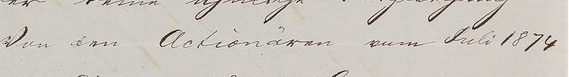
Von den Actionären vom Juli 1874
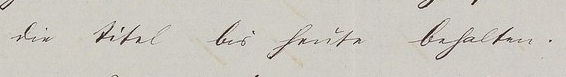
die Titel bis heute behalten.
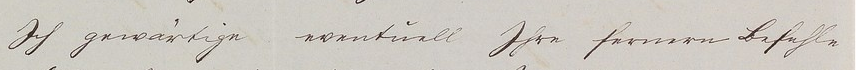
Ich gewärtige eventuell Ihre fernern Befehle
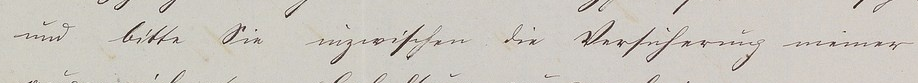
und bitte Sie inzwischen die Versicherung meiner
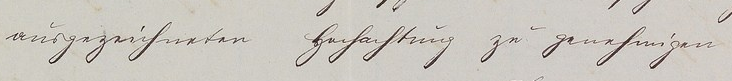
ausgezeichneten Hochachtung zu genehmigen
